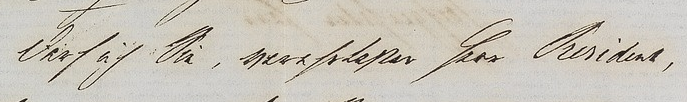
Darf ich Sie, verehrtester Herr President,
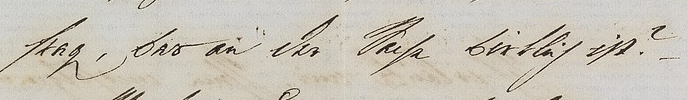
fragen, was an der Sache wirklich ist? –
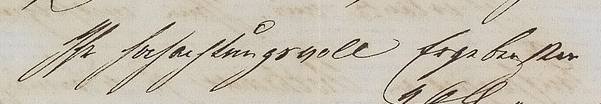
Ihr hochachtungsvoll Ergebenster
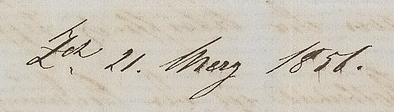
21. Merz 1856.
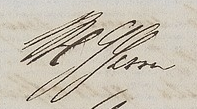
MHHerrn
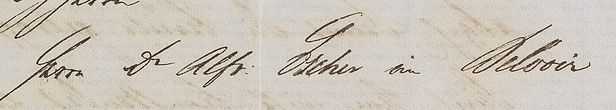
Herrn Dr Alfr: Escher im Belvoir
